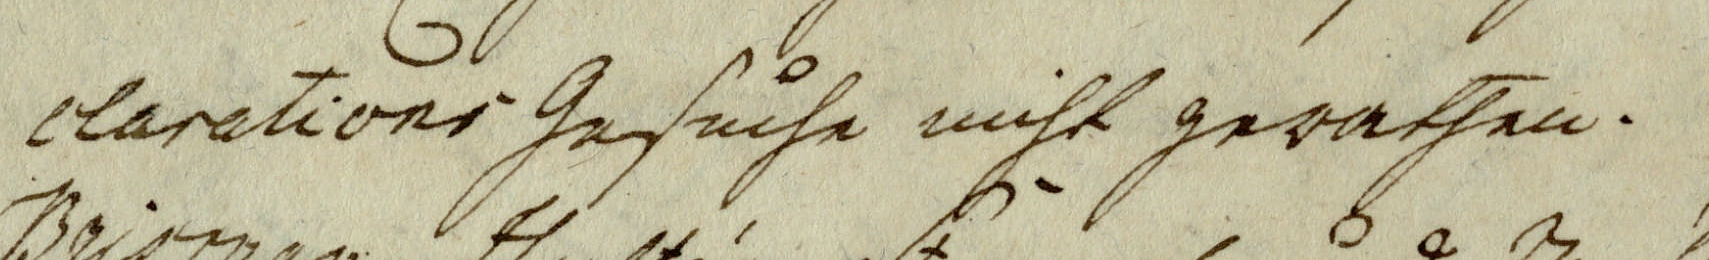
clarations Gesuche nicht gerathen.
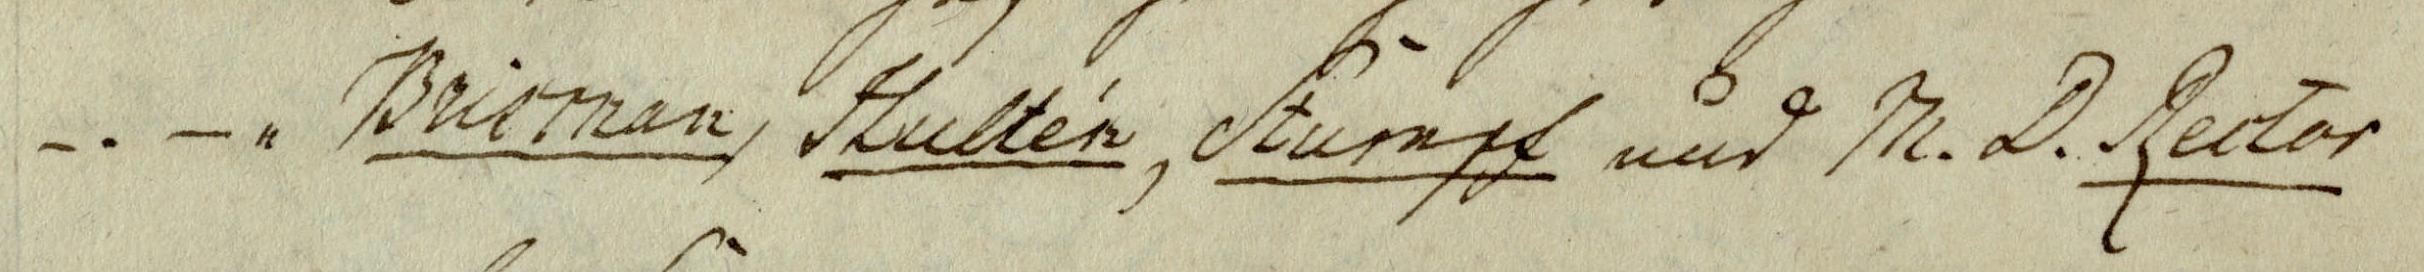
Brisman, Hultén, Stumpf und M. D. Rector
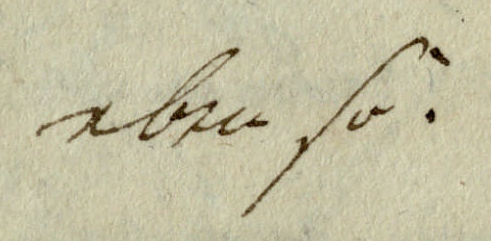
eben so.
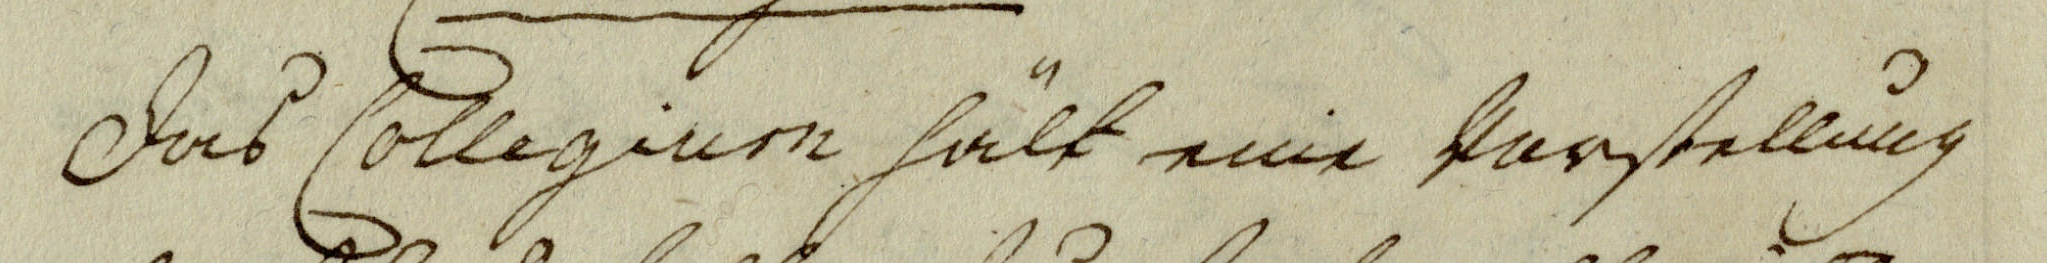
das Collegium hat eine Vorstellung
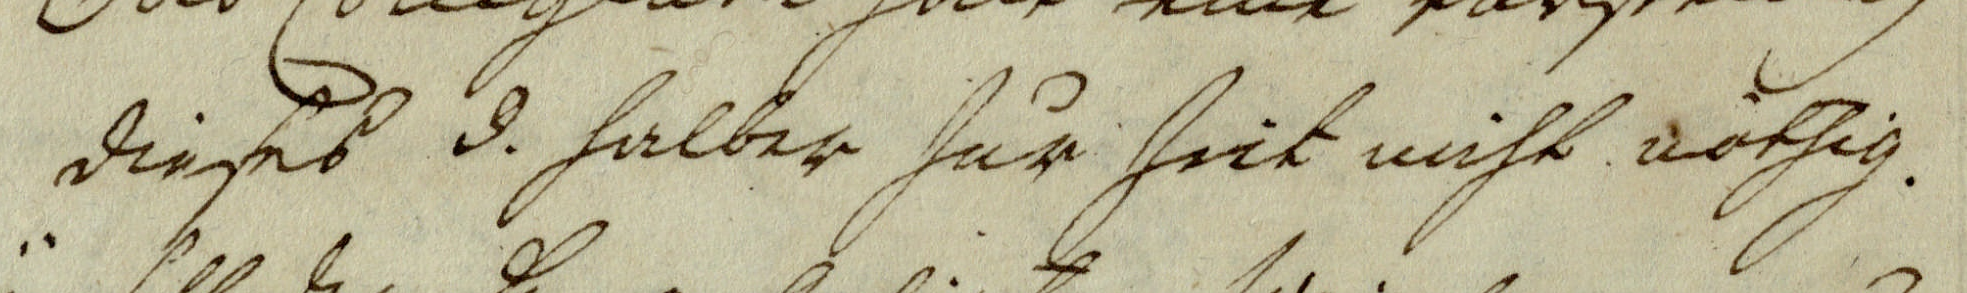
dieses . halte zur Zeit nicht nöthig
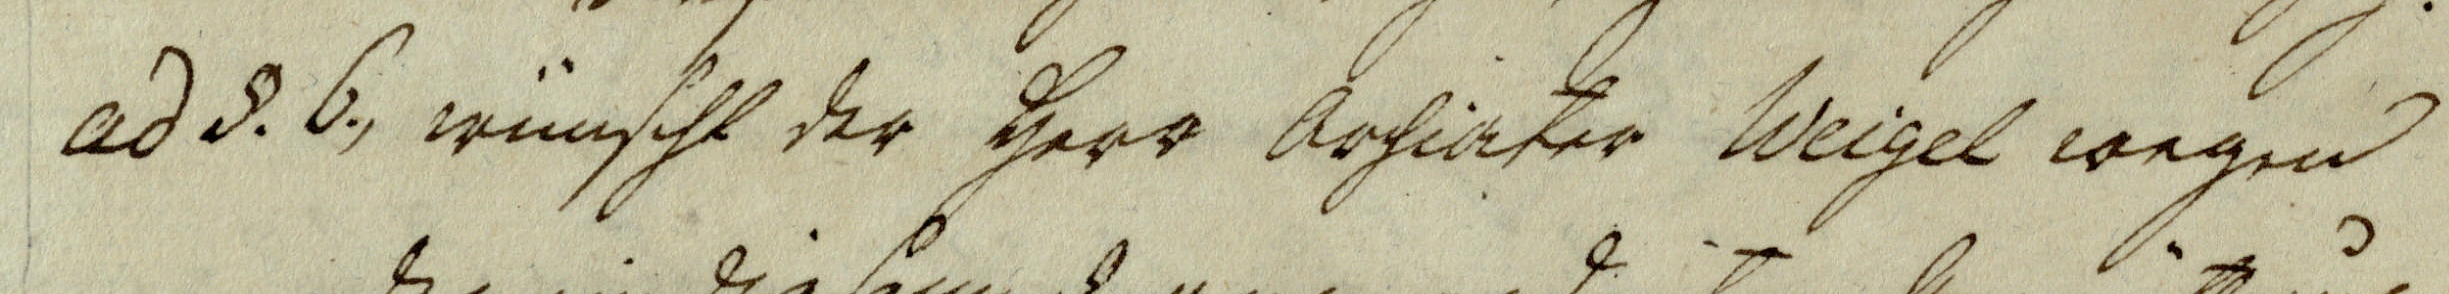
ad d. 6., wünscht der Herr Arsiater Weigel wegen
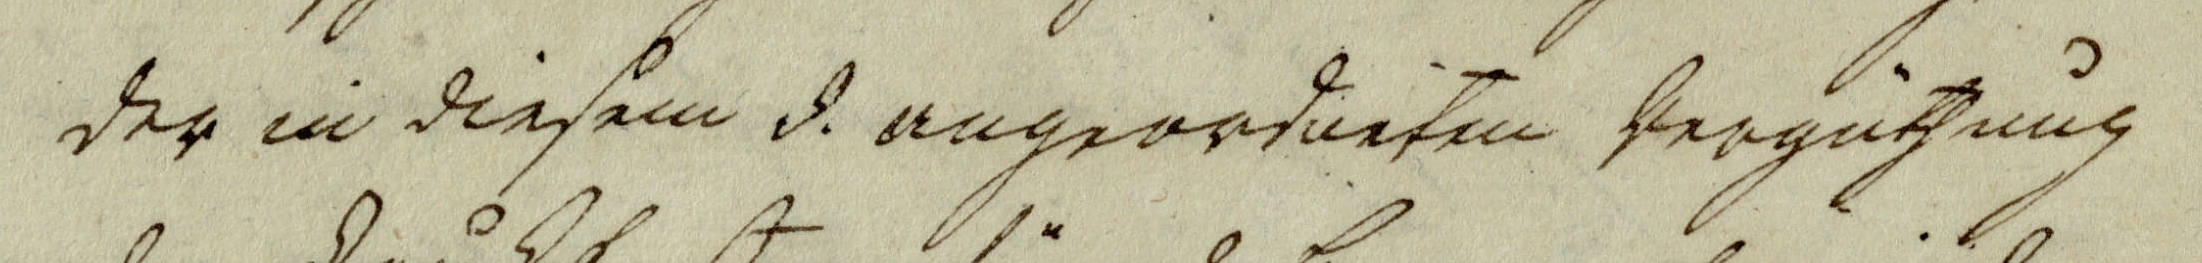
der in diesem §. angeordneten Vergüthung
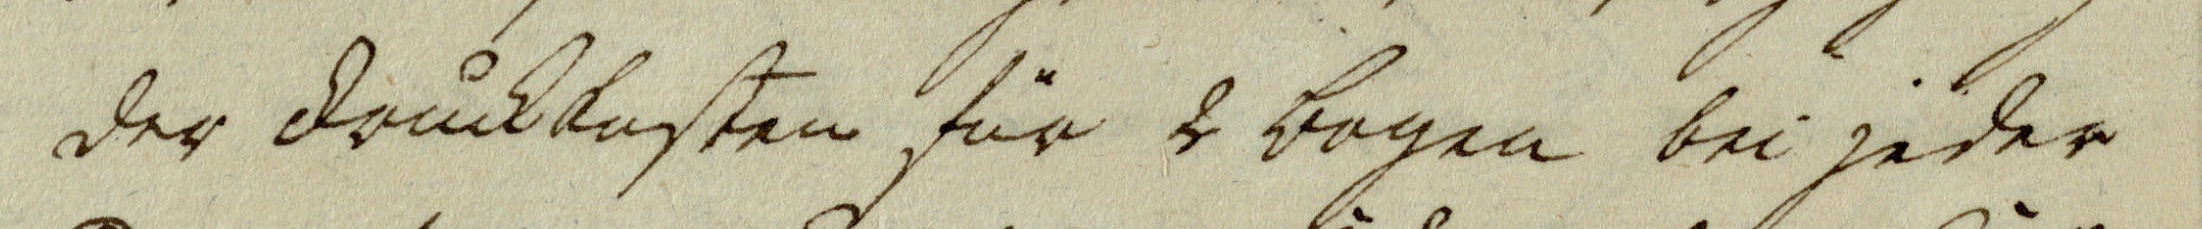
der DonckLosten für 2 Bogen bei jeder
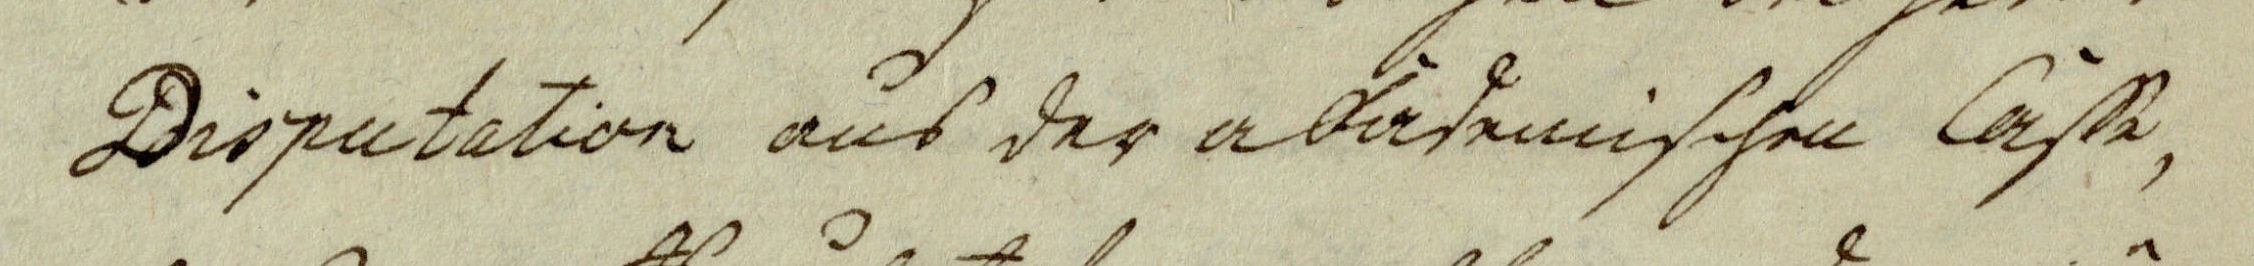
Disputation aus der akademischen Casse,
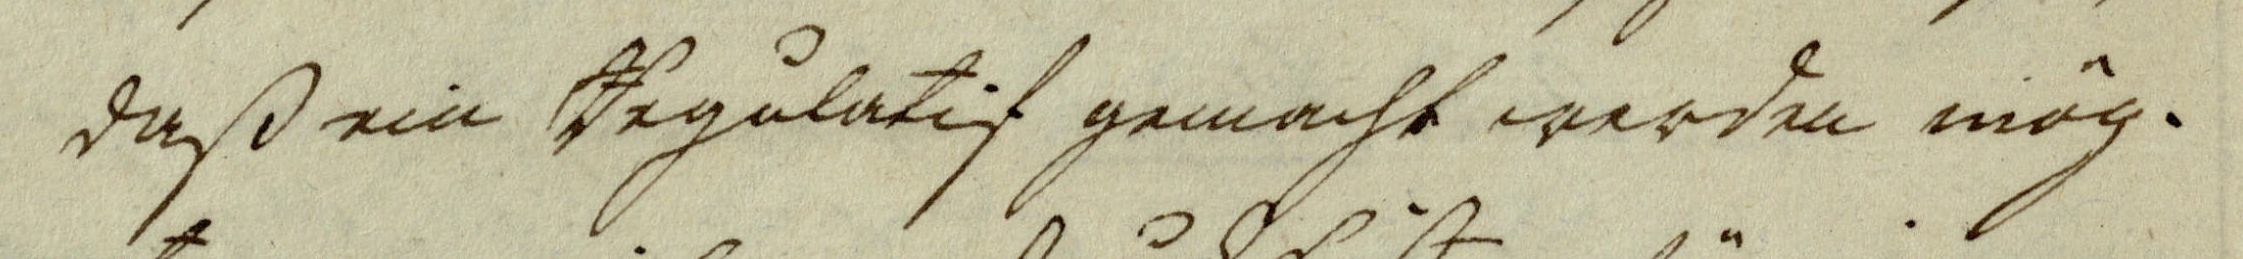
daß ein Repulatif gemacht werden möge
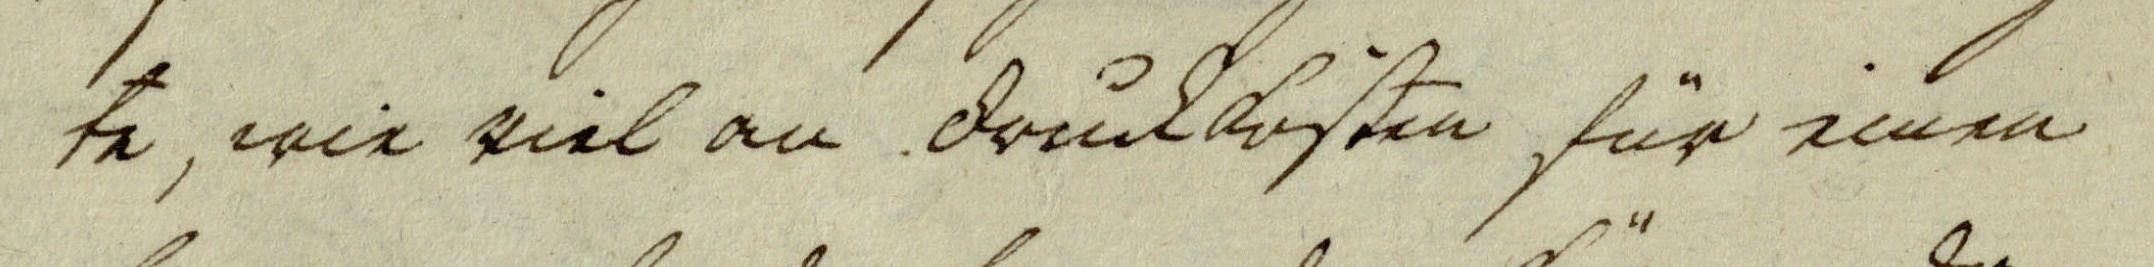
te, wie viel an rucklostem für einen
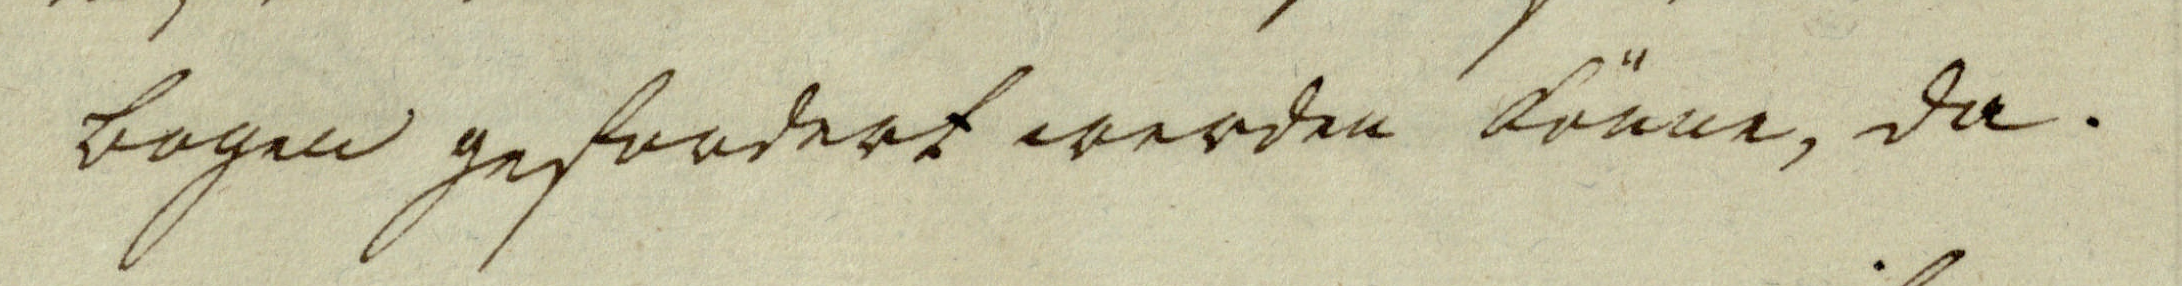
Bogen gefordert werden könne, da-
